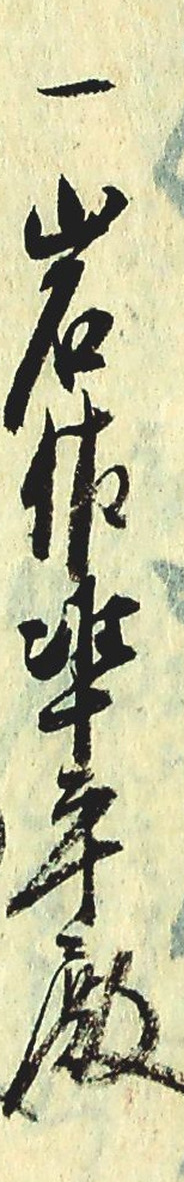一岩佐準平殿
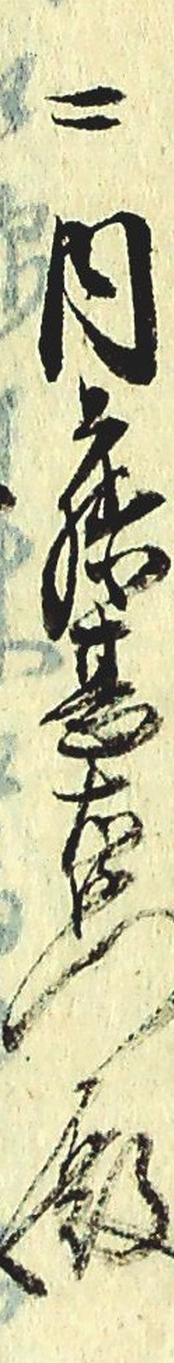二内藤甚右衛門殿
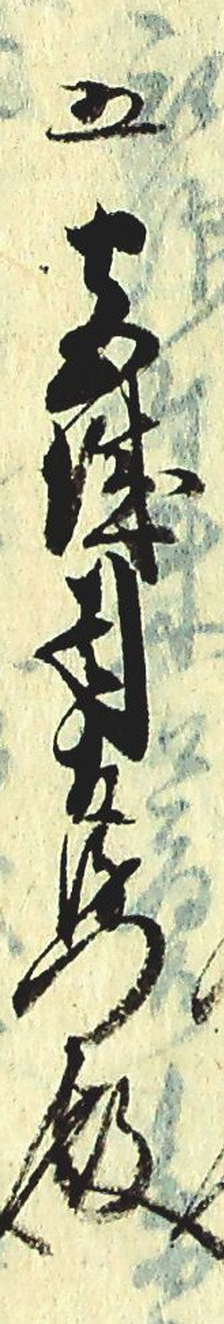五宮城周左衛門殿
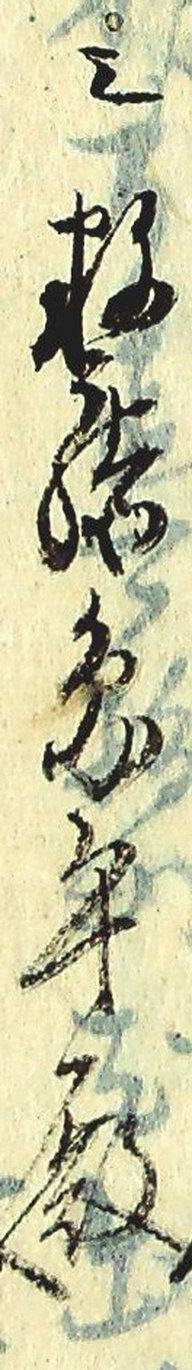三数藤円平殿
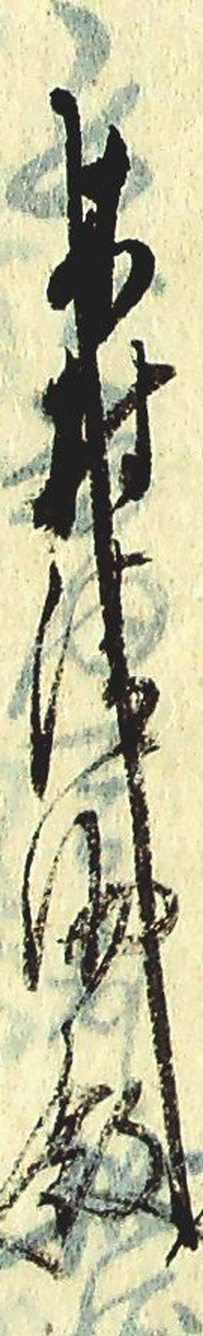木村清助殿
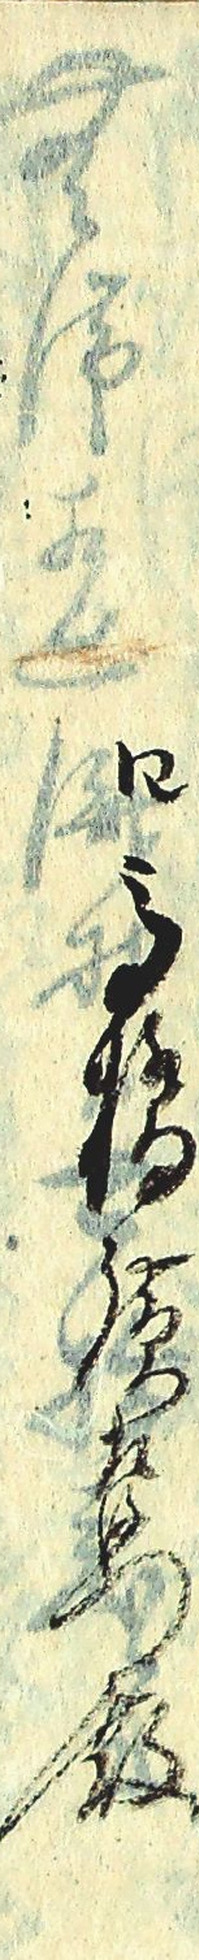四高橋広左衛門殿
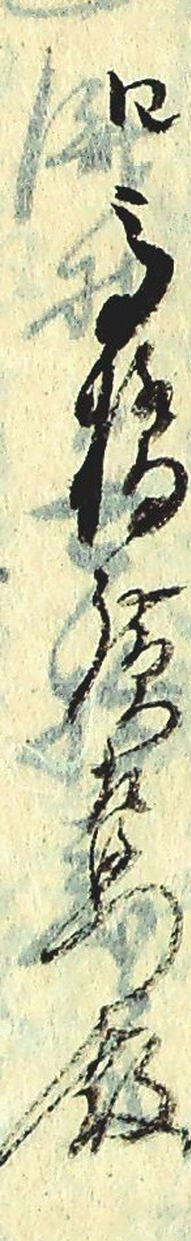四高橋広左衛門殿
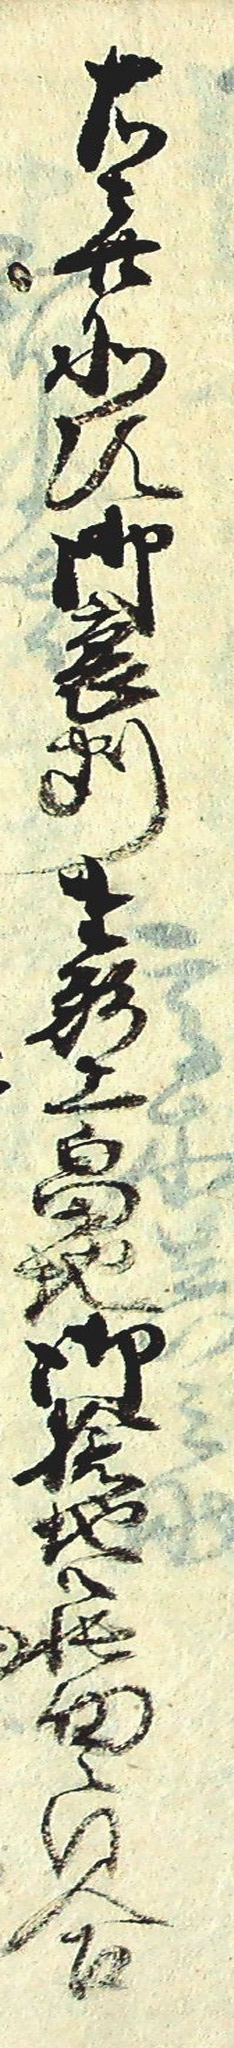右喜和次御裏判奉願上畠地御検地御帳面に引合

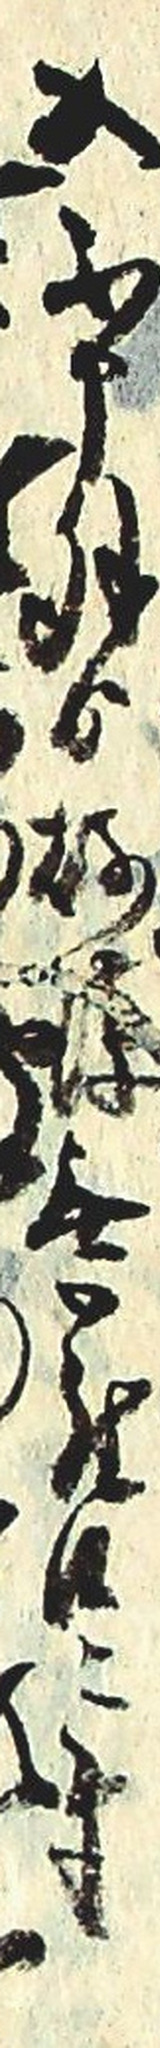入不申外ゟ故障無御座候に付
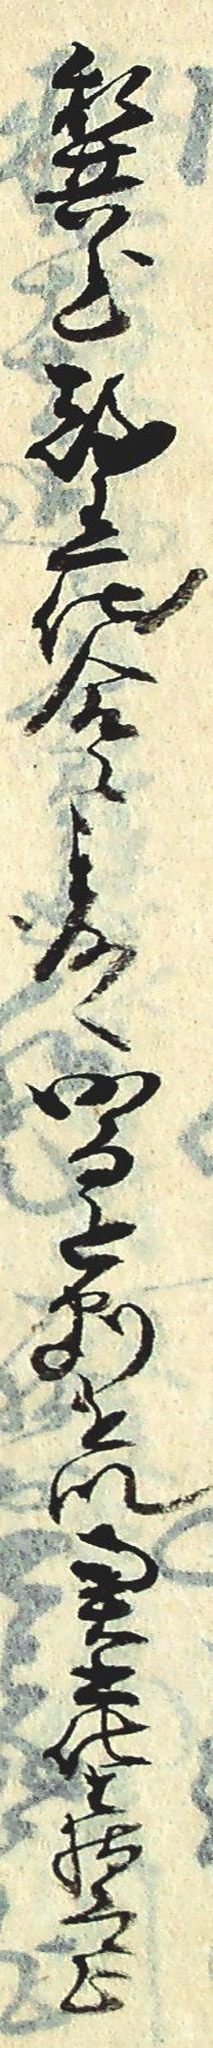私共迄難有仕合に奉存候仍て連判を以奥書仕奉指上候以上
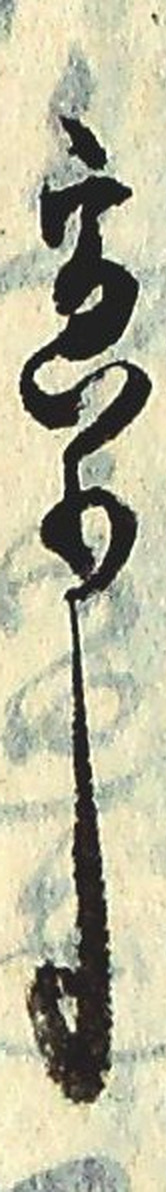寅五月
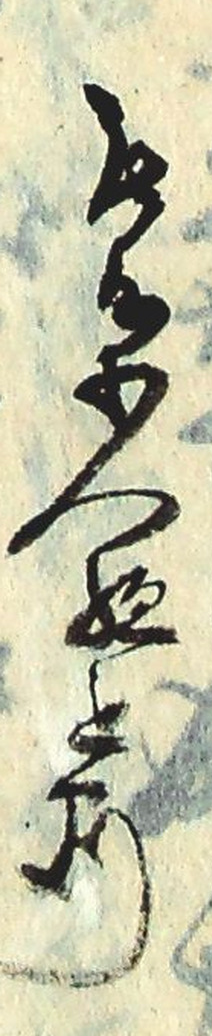庄屋五人組連判
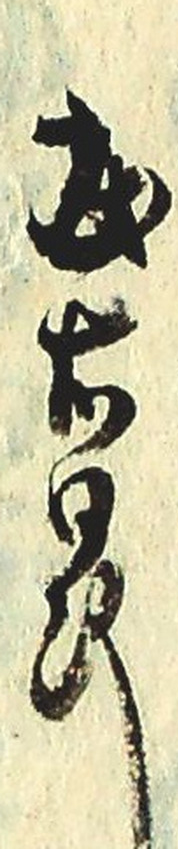当右同断
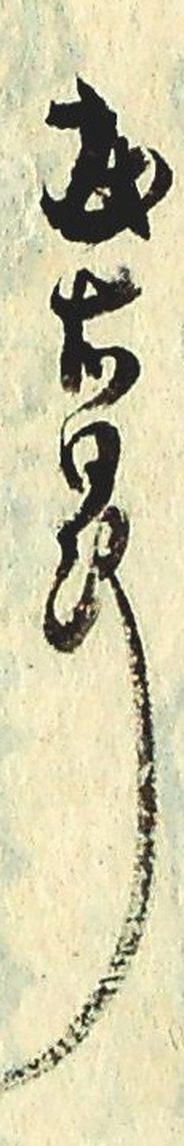当右同断
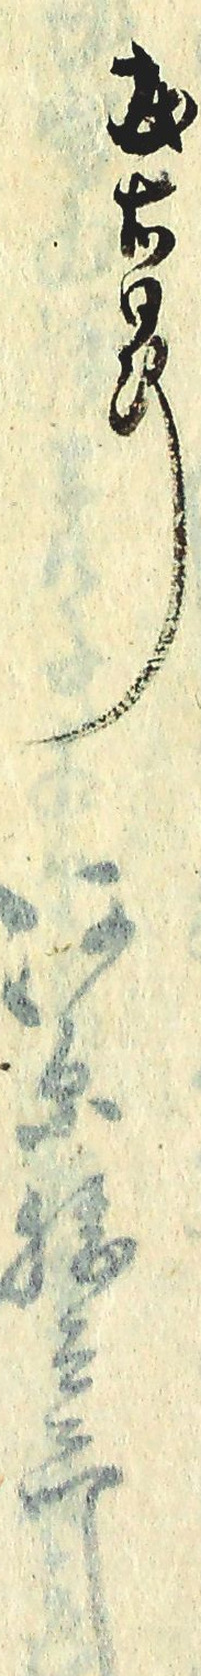当右同断
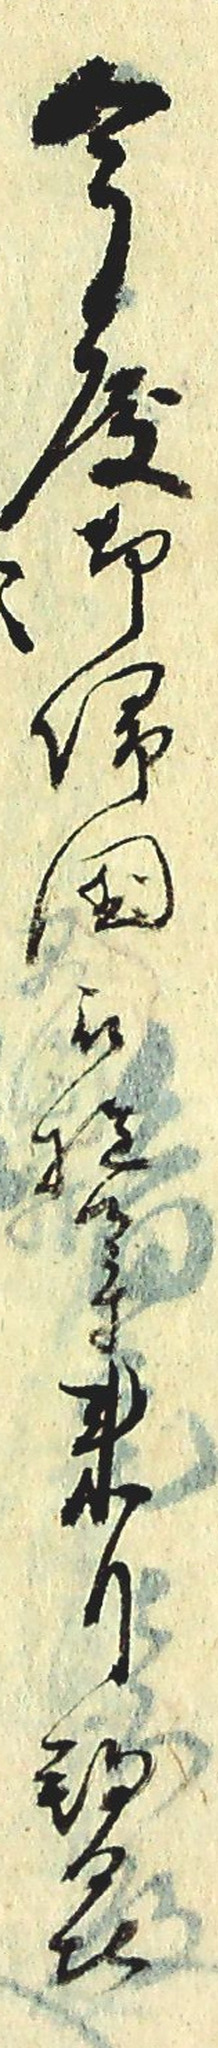今度御帰国被遊候に付来月朔日比
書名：諸御願書控(弐番）
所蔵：鳴門教育大学 Naruto University of Education
